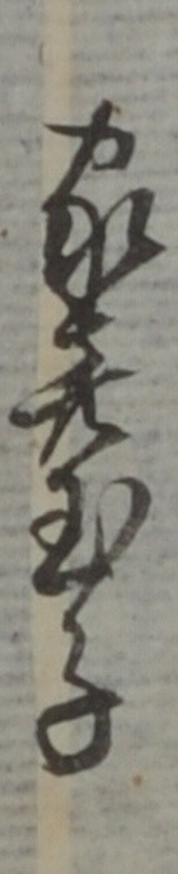家喜玉子
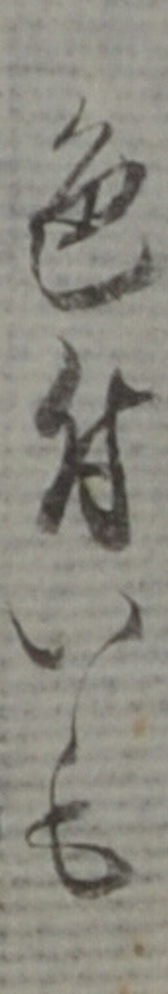色付いも
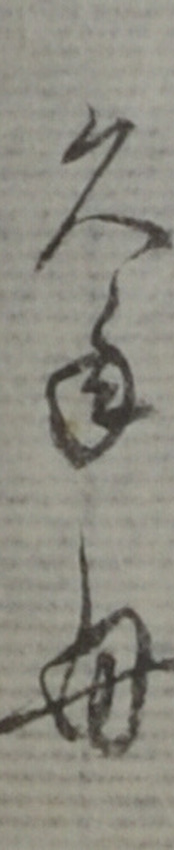久年母
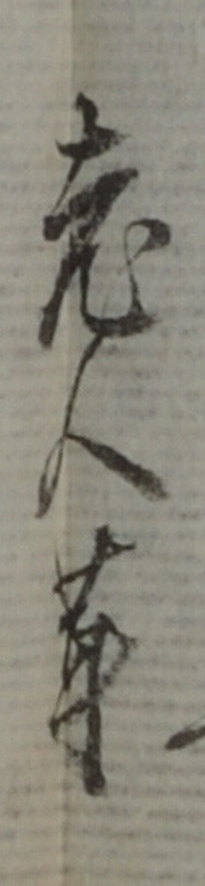老人茸
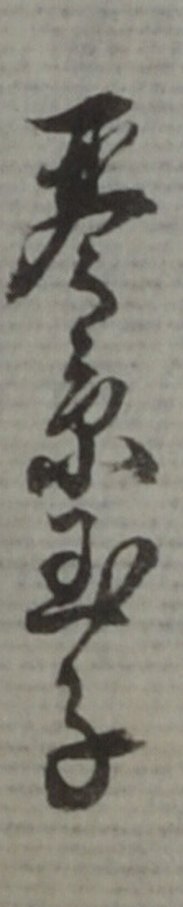琴糸玉子
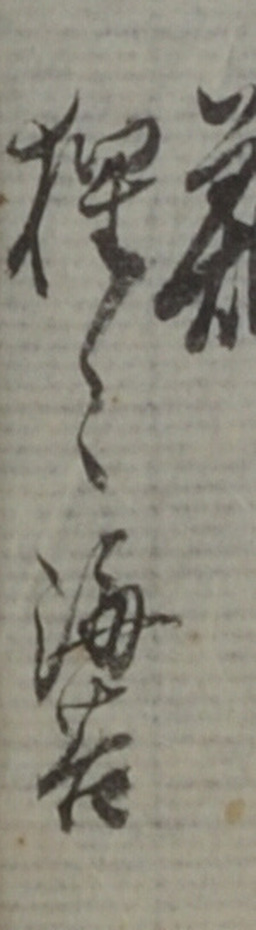猩々海苔
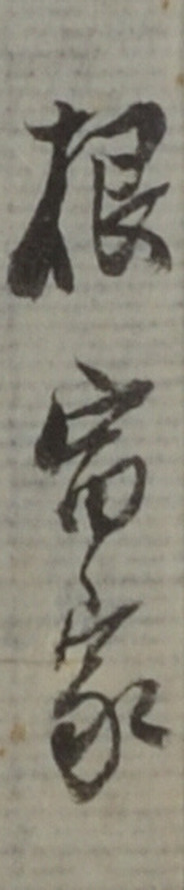根冨家
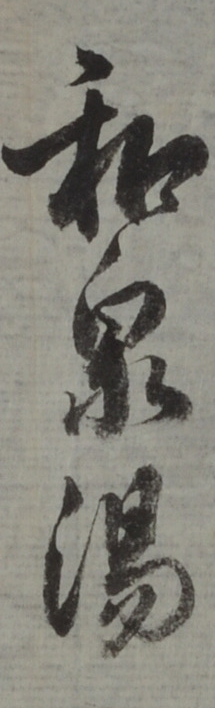和泉湯
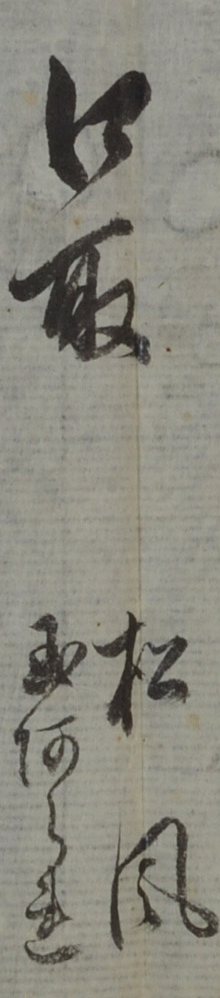口取松風
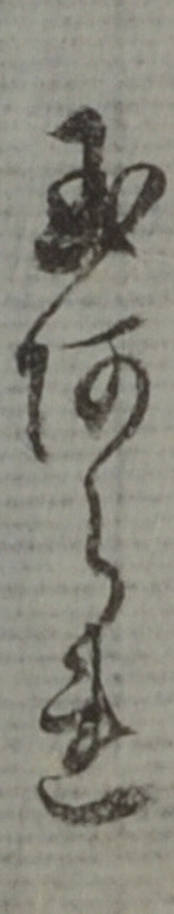玉あられ
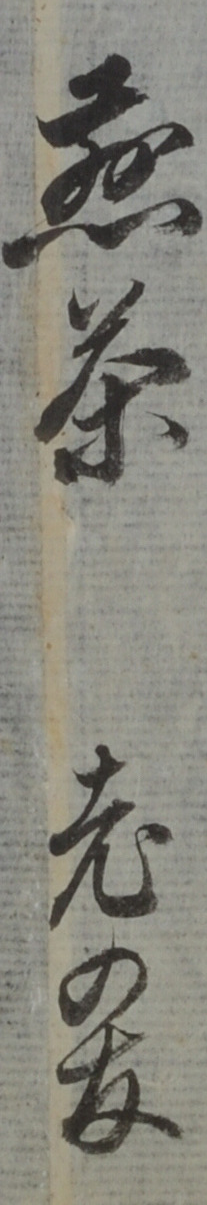煎茶老の友
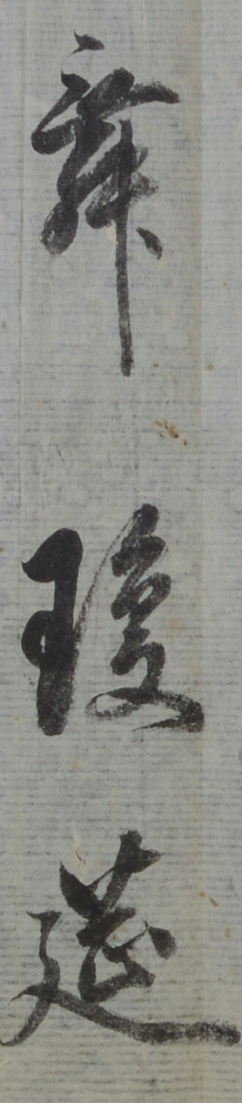舞瓊莚

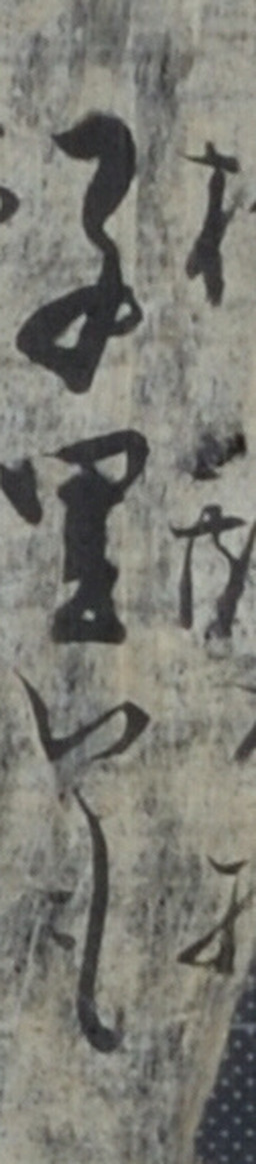子里いも
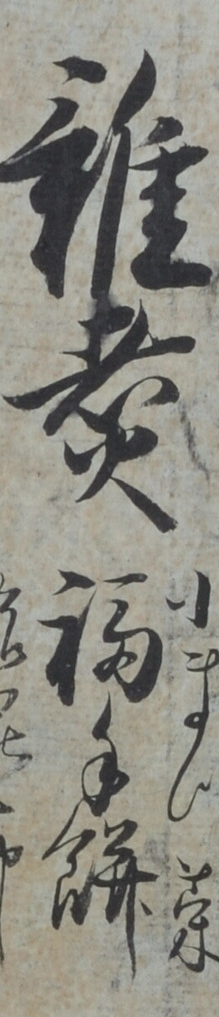雑煮福手餅
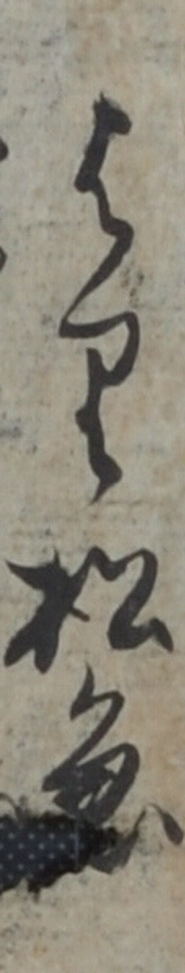より松魚
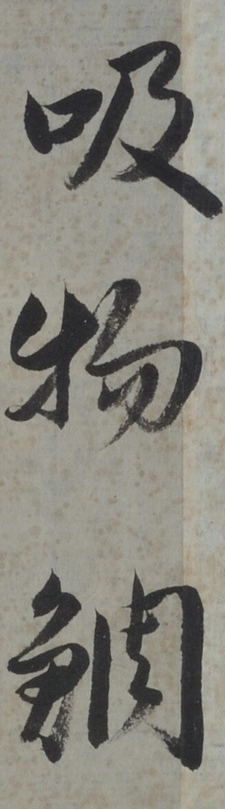吸物鯛
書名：献立書上
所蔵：伊那市立高遠町図書館・合同会社AMANE
